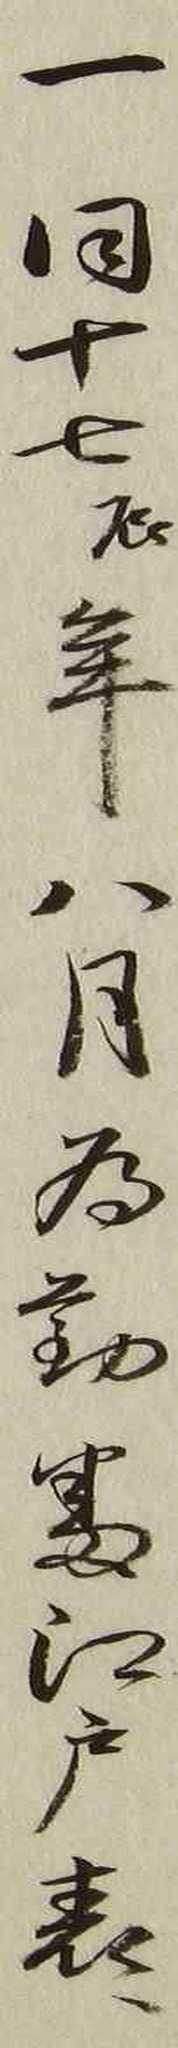一同十七辰年八月為勤番江戸表へ
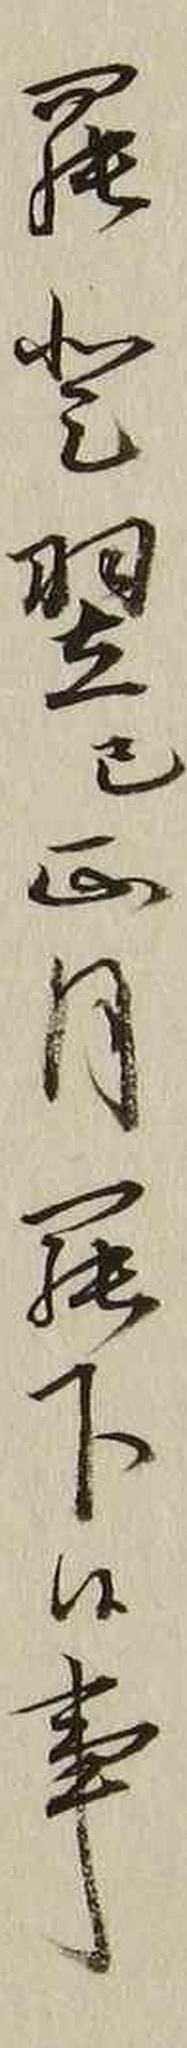罷登翌己正月罷下候事
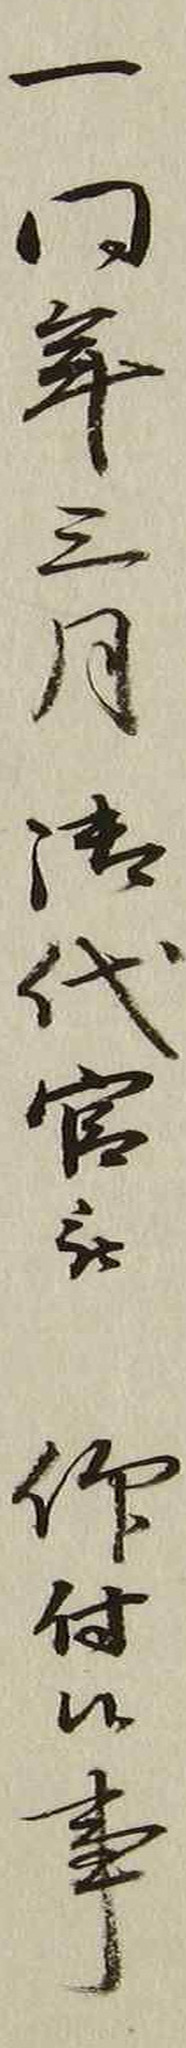一同年三月御代官被仰付候事
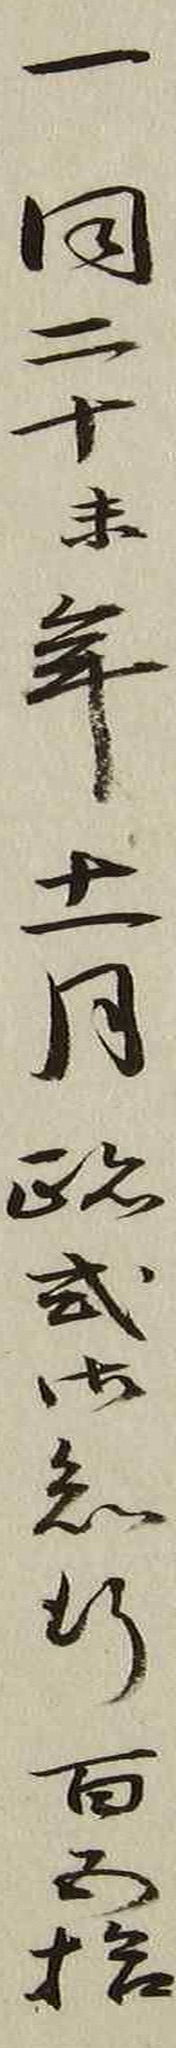一同二十未年十一月跡式御知行百五拾
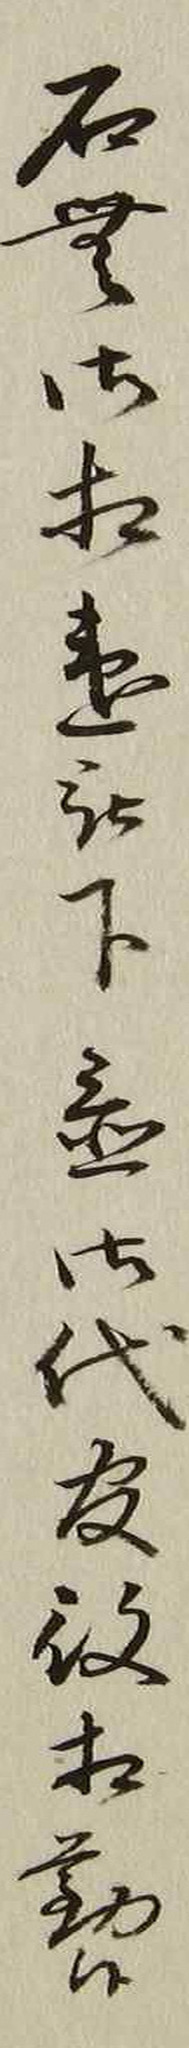石無御相違被下置御代官役相勤候
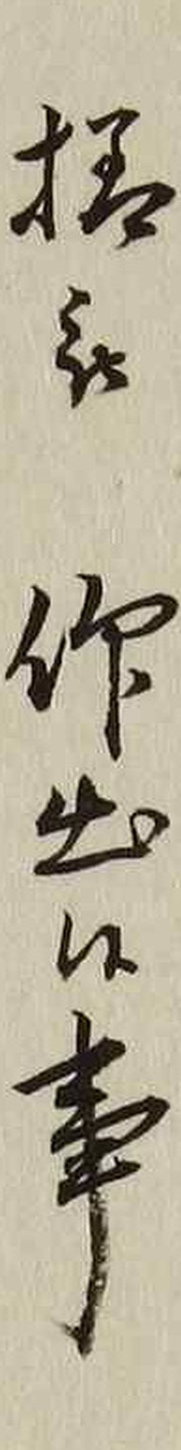様被仰出候事
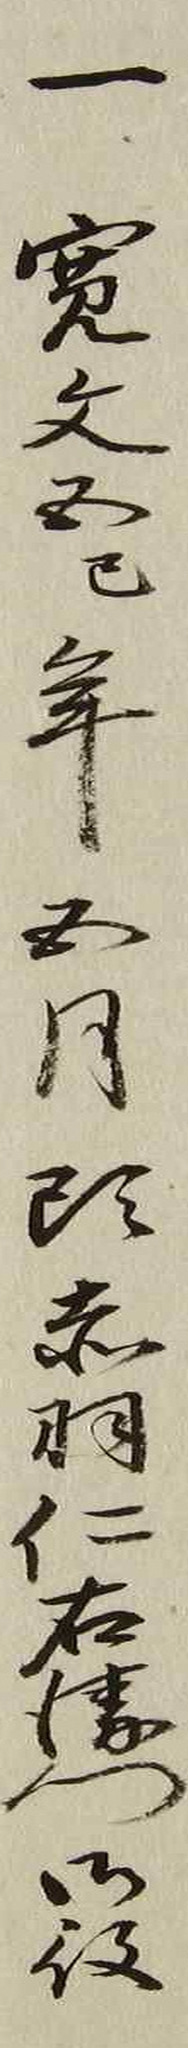一寛文五巳年五月頭赤羽仁右衛門御役
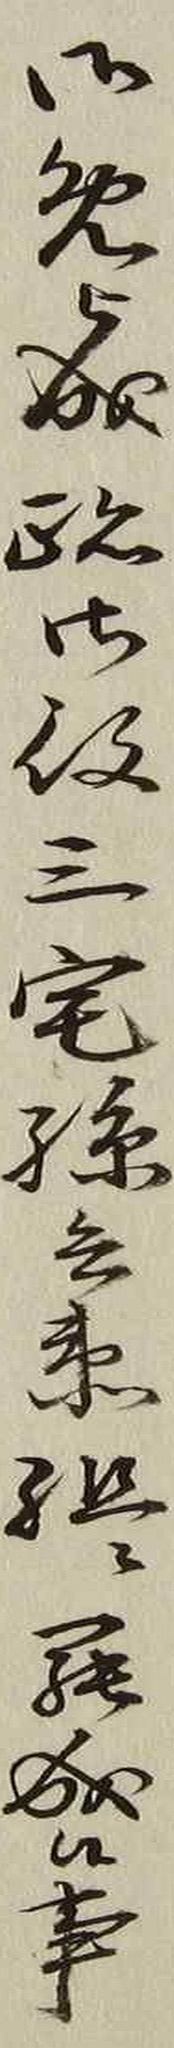御免被成跡御役三宅孫兵衛組ニ罷成候事
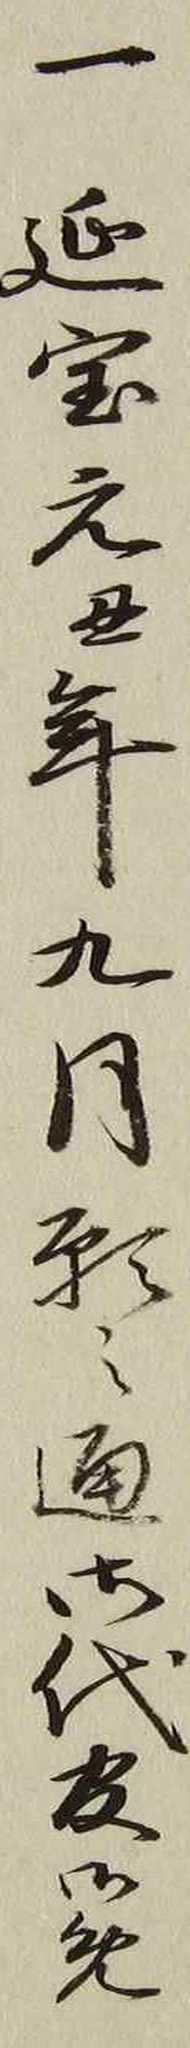一延宝元丑年九月願之通御代官御免
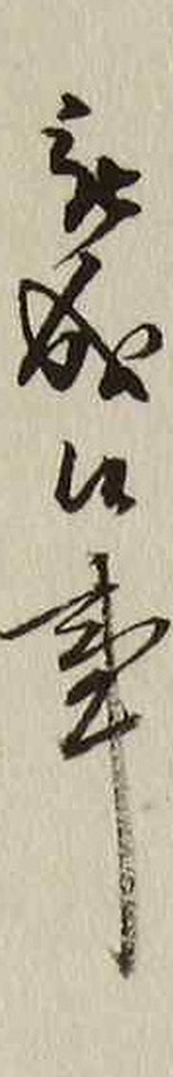被成候事
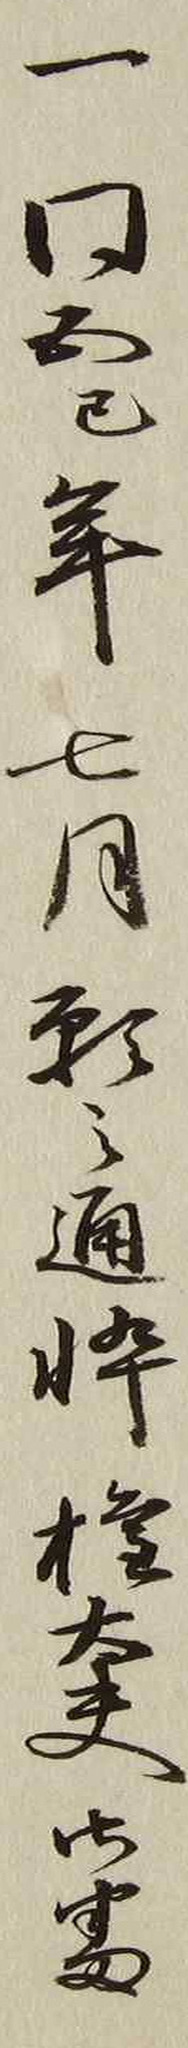一同五巳年七月願之通忰権太夫御番
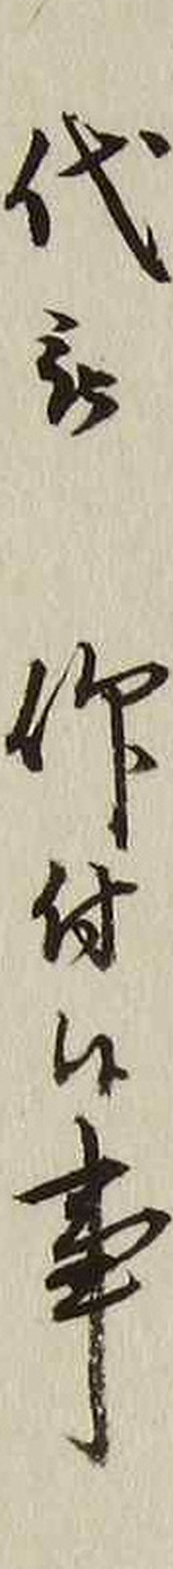代被仰付候事
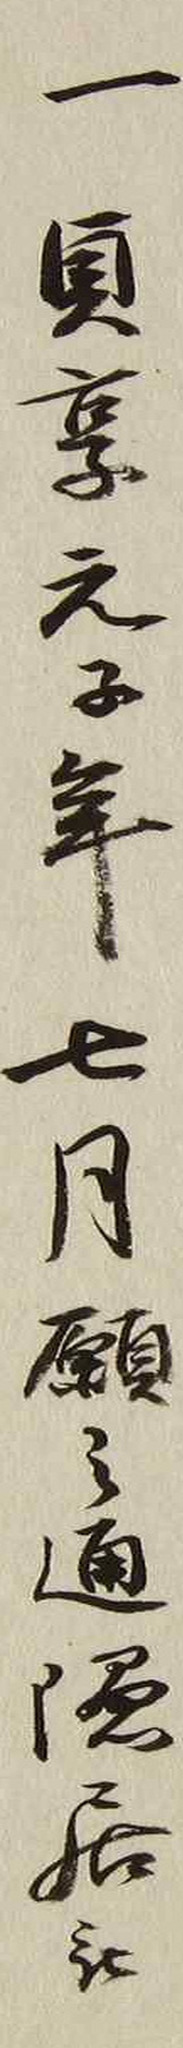一貞享元子年七月願之通隠居被
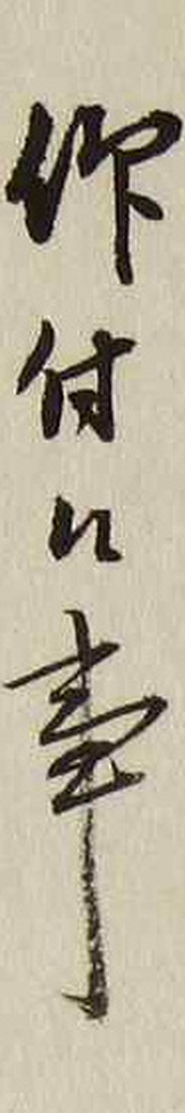仰付候事
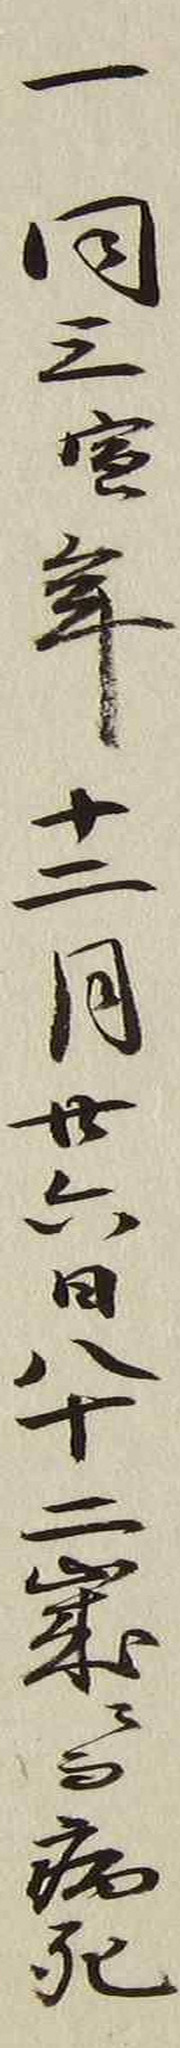一同三寅年十二月廿六日八十二歳ニ而病死
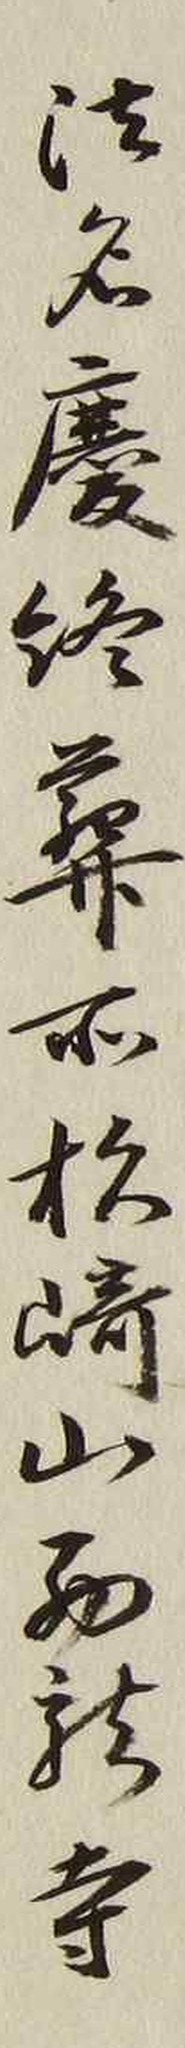法名慶終葬所杉崎山西龍寺
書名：諸士系譜　巻之160　な之部2
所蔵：会津若松市立会津図書館
